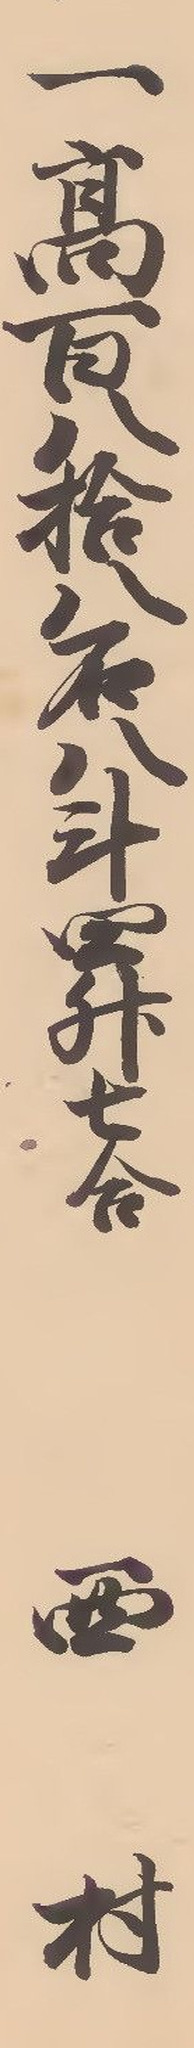一高百八拾八石八斗四升七合西村

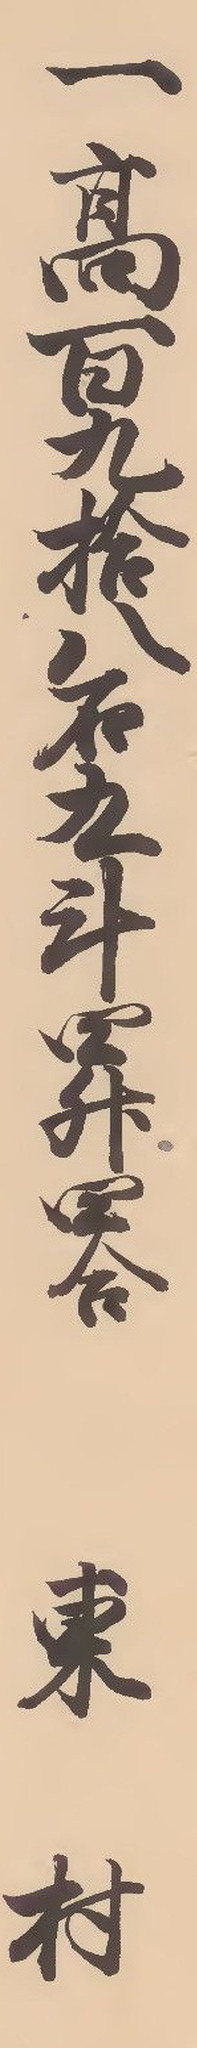一高百九拾八石九斗四升四合東村
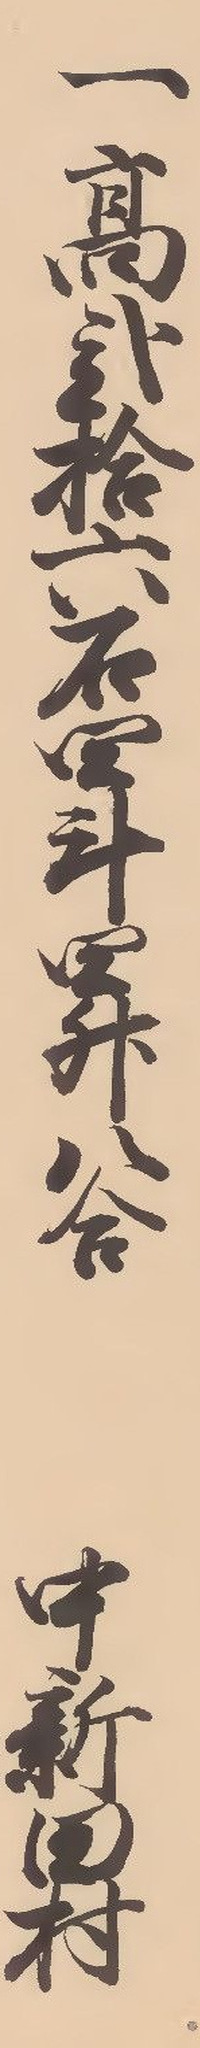一高弐拾六石四斗四升八合中新田村
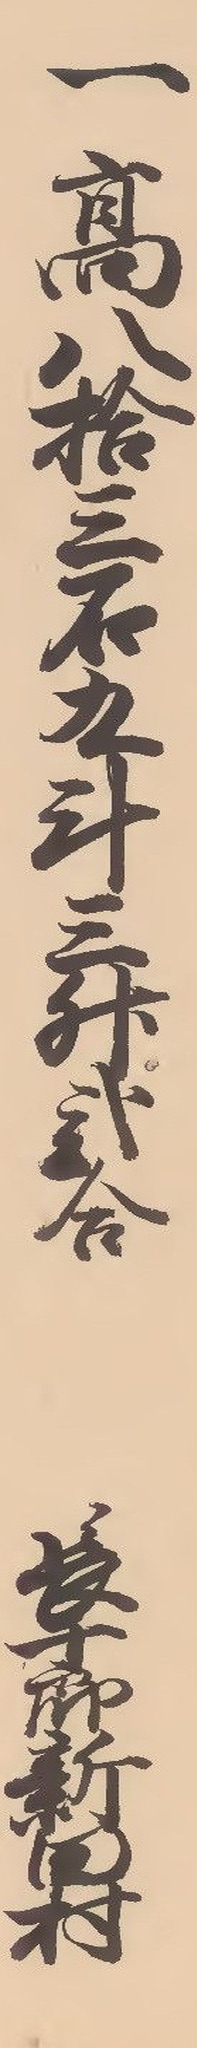一高八拾三石九斗三升弐合長十郎新田村
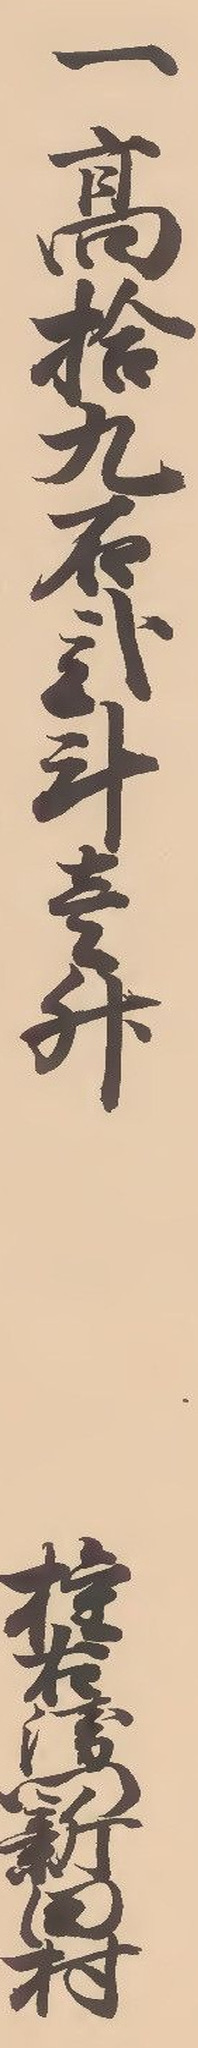一高拾九石弐斗壱升権右衛門新田村
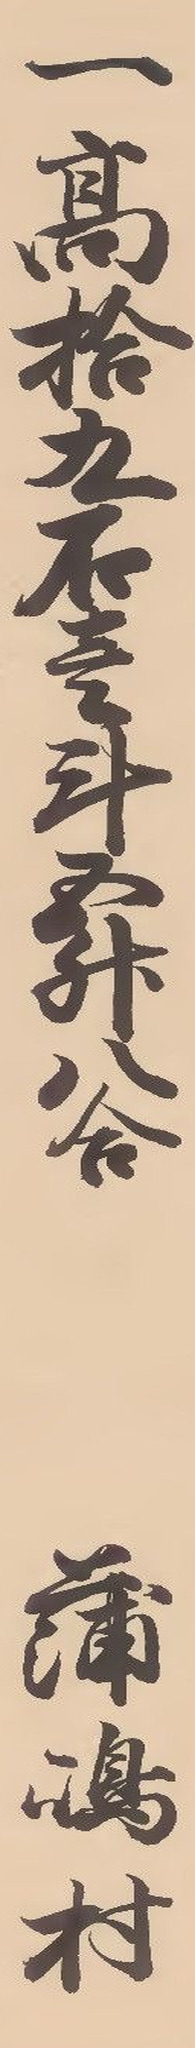一高拾九石壱斗五升八合蒲島村
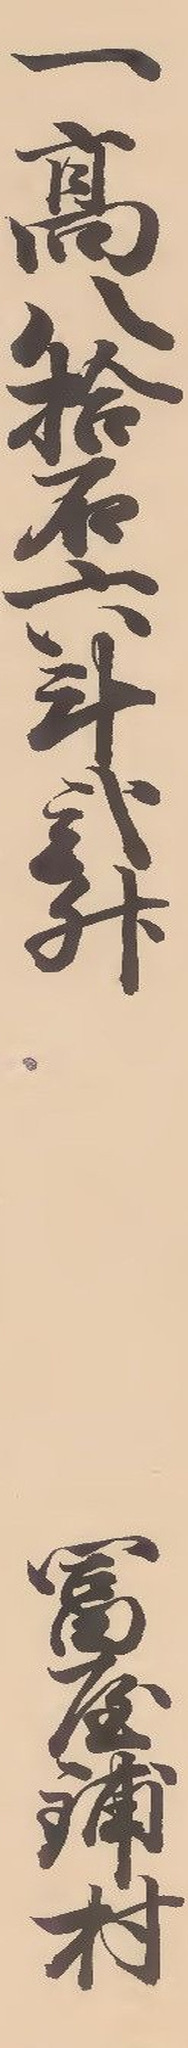一高八拾石六斗弐升富屋舗村
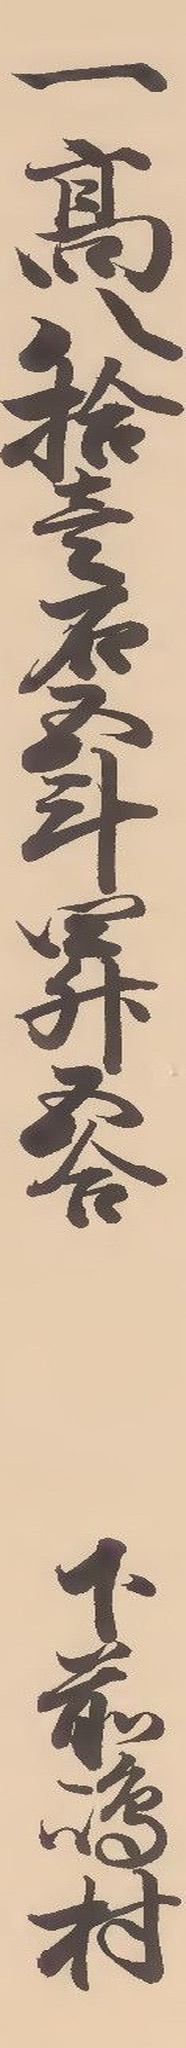一高八拾壱石五斗四升五合下前島村
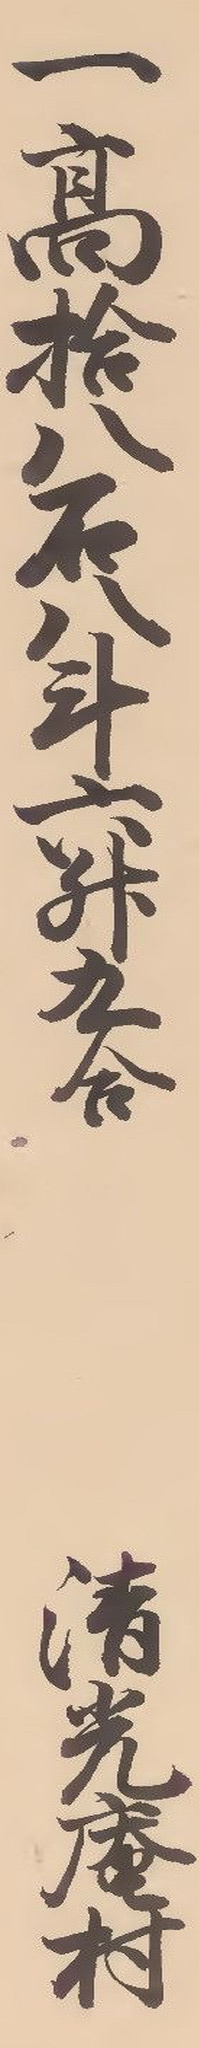一高拾八石八斗六升九合清光庵村

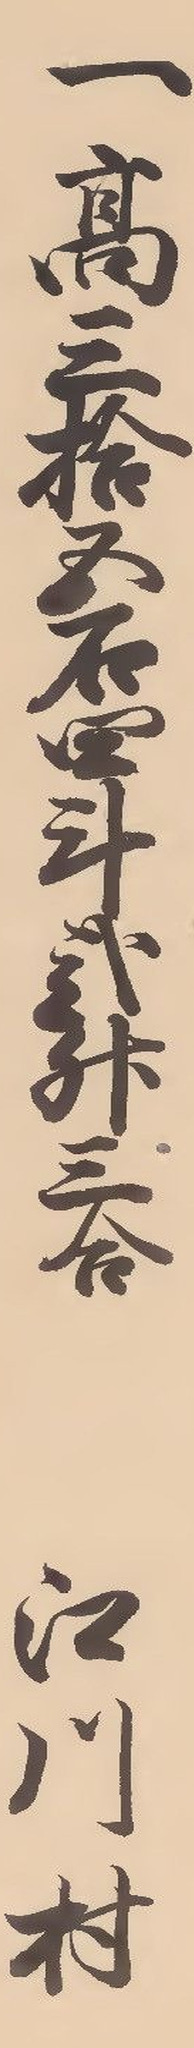一高三拾五石四斗弐升三合江川村
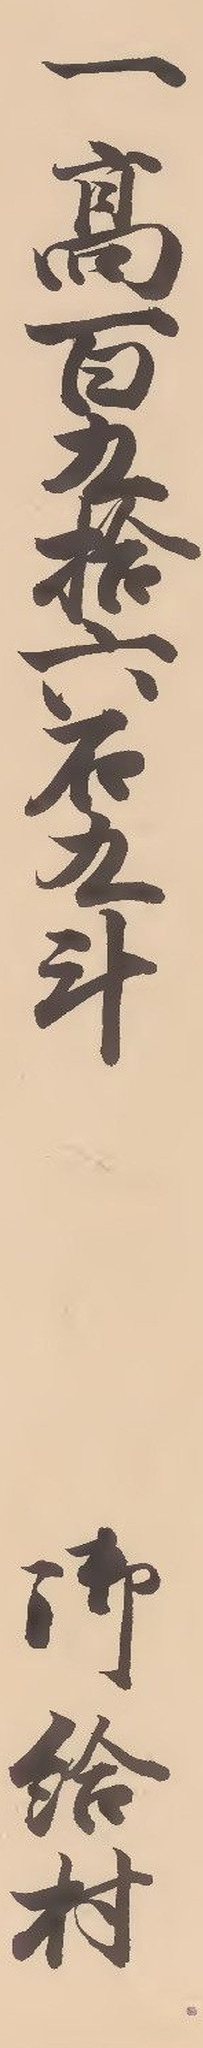一高百九拾六石九斗御給村
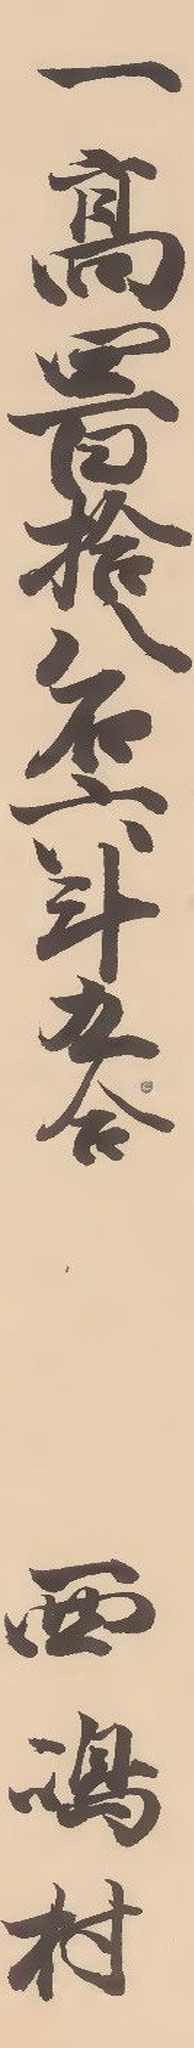一高四百拾八石六斗九合西島村
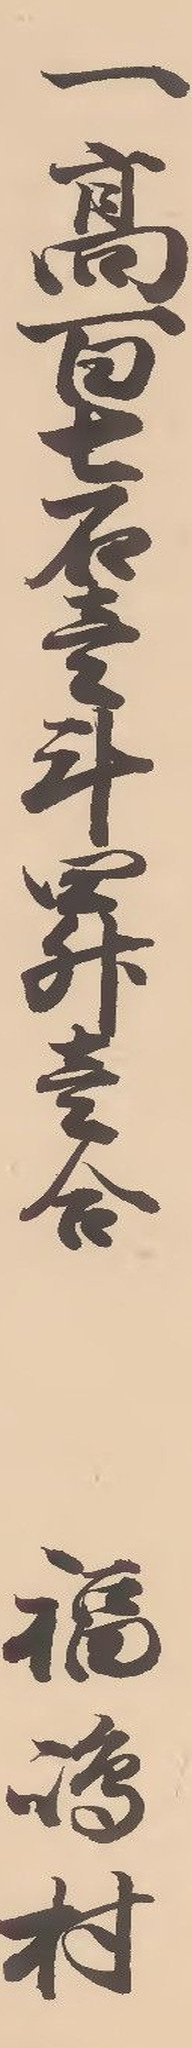一高百七石壱斗四升壱合福島村
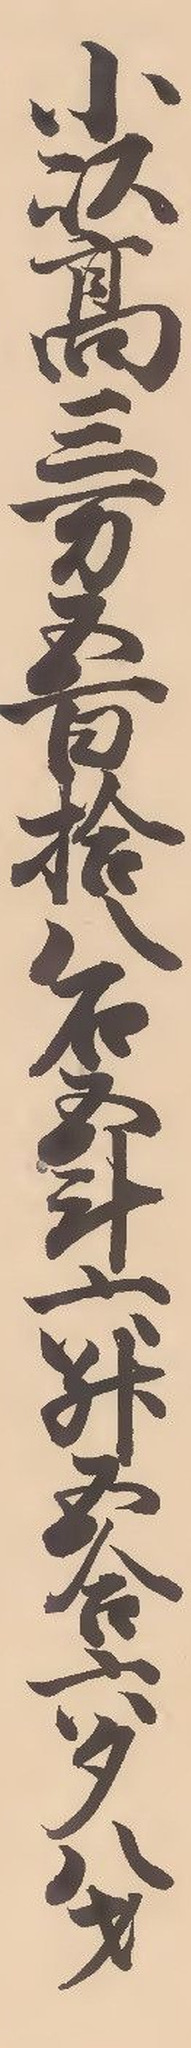小以高三万五百拾八石五斗六升五合六勺八才

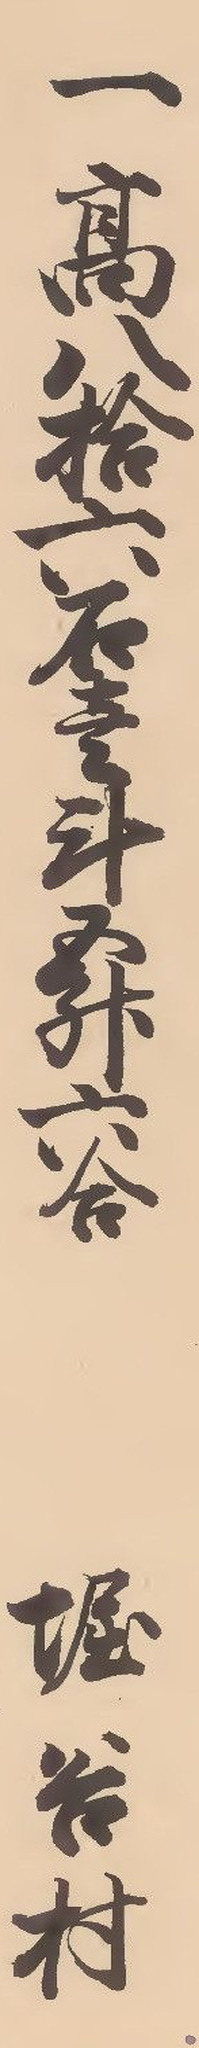一高八拾六石壱斗五升六合堀谷村
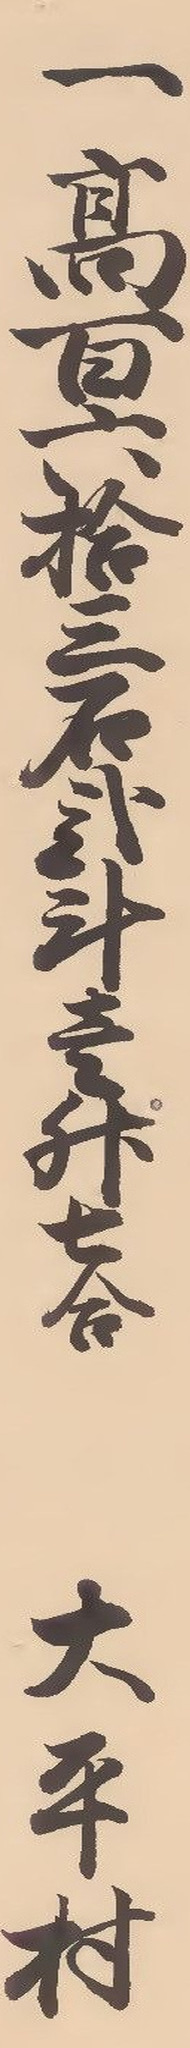一高百六拾三石弐斗壱升七合大平村
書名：遠江国郷帳
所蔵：国立公文書館 National Archives of Japan
